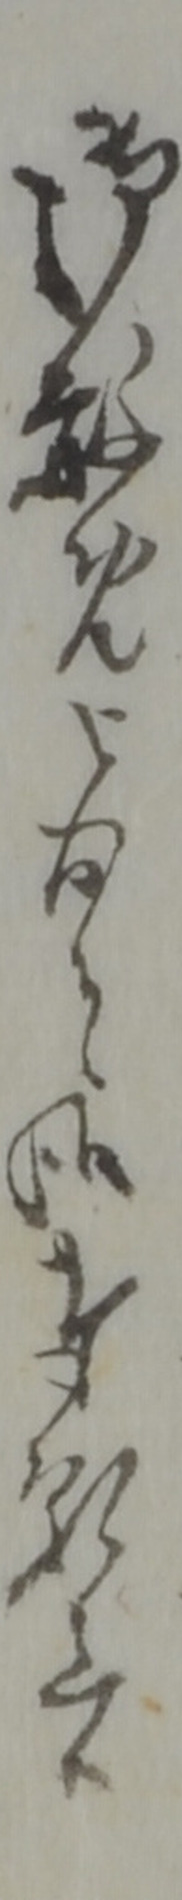御赦免被成下候様奉願上候
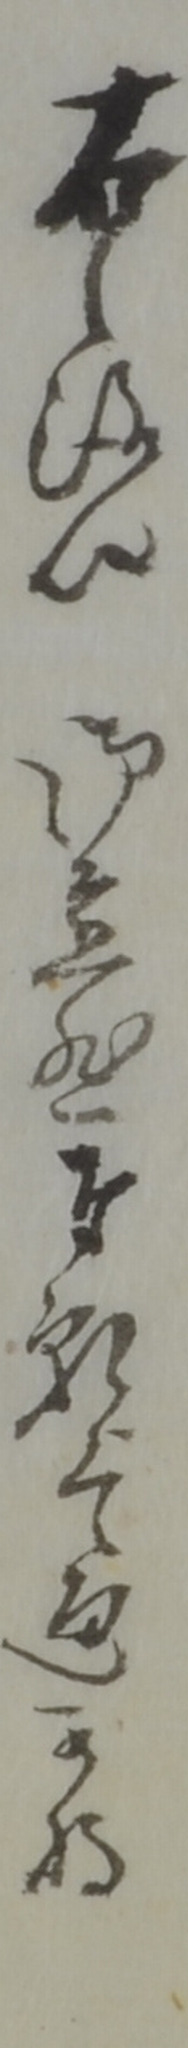右之趣以御慈悲奉願上候通被為仰付
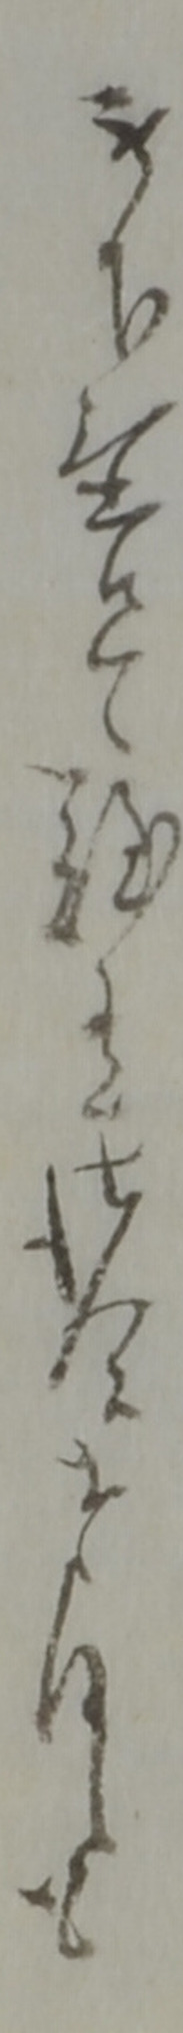被下置候ハヽ難有仕合奉存候已上
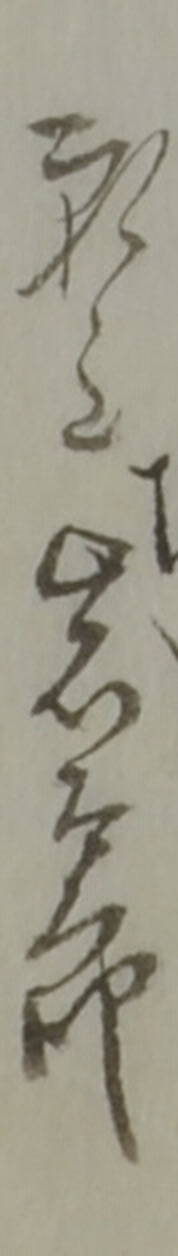願主岩太郎
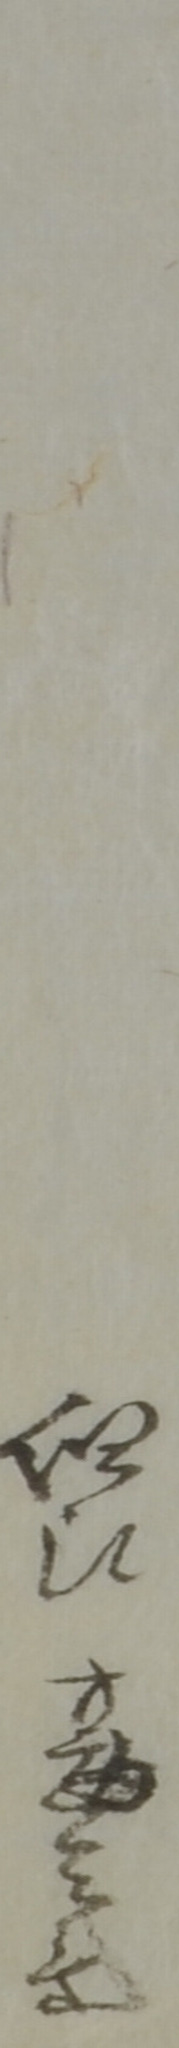組頭勘兵衛
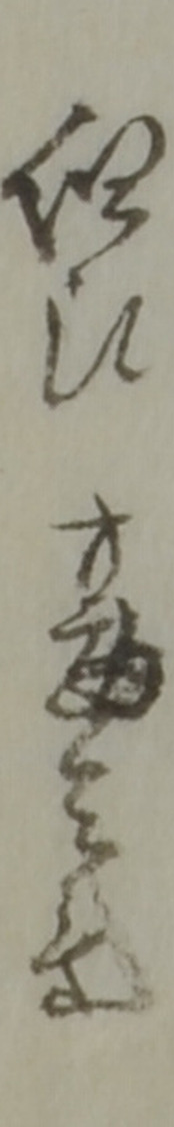組頭勘兵衛
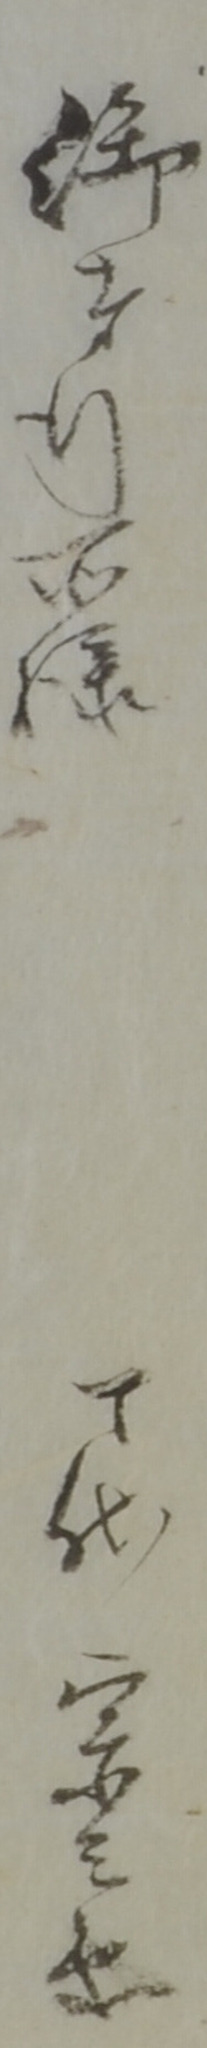御奉行所様丁代宗兵衛
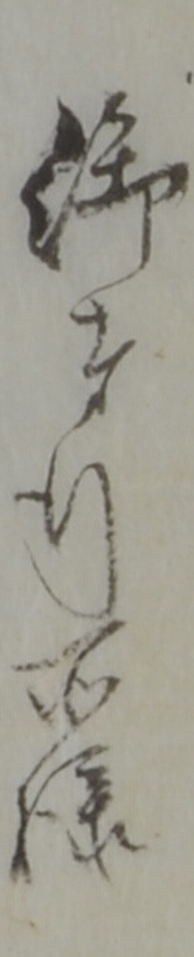御奉行所様
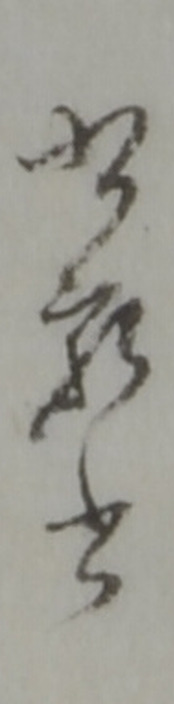右願書
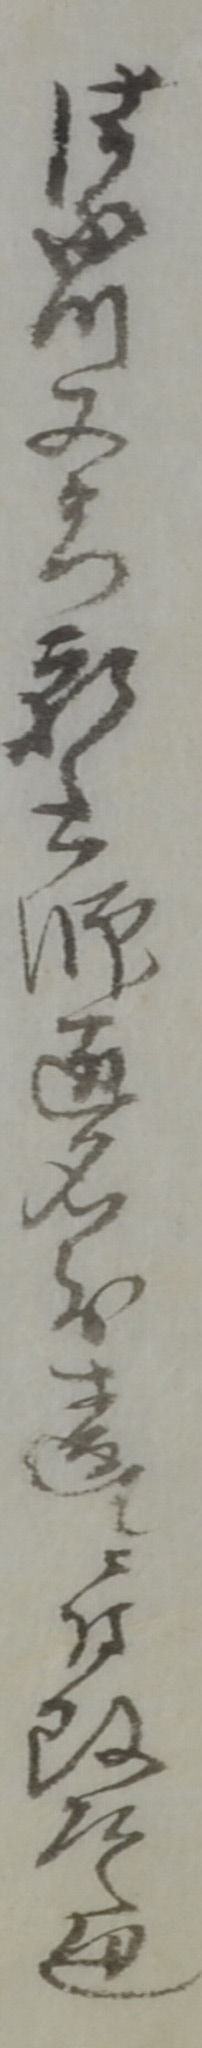清水町又右衛門願書師匠名前違候ニ付改左之通
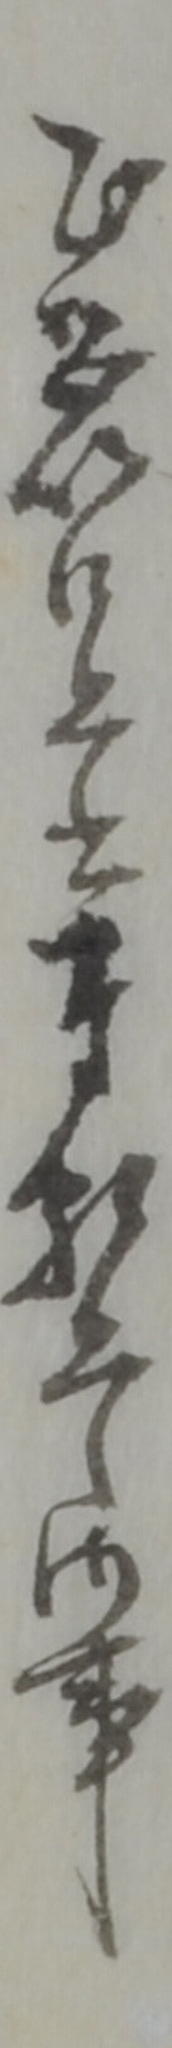乍恐以口上書奉願上候御事
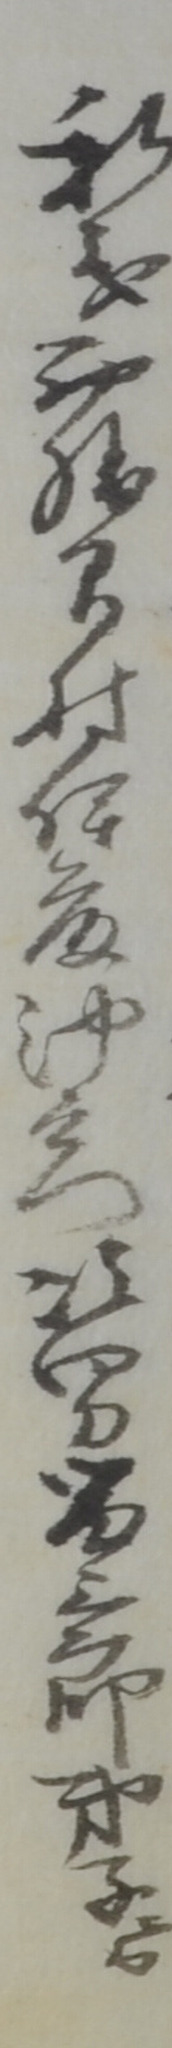私義西勝間村伊藤沖右衛門次男留三郎弟子ニ而

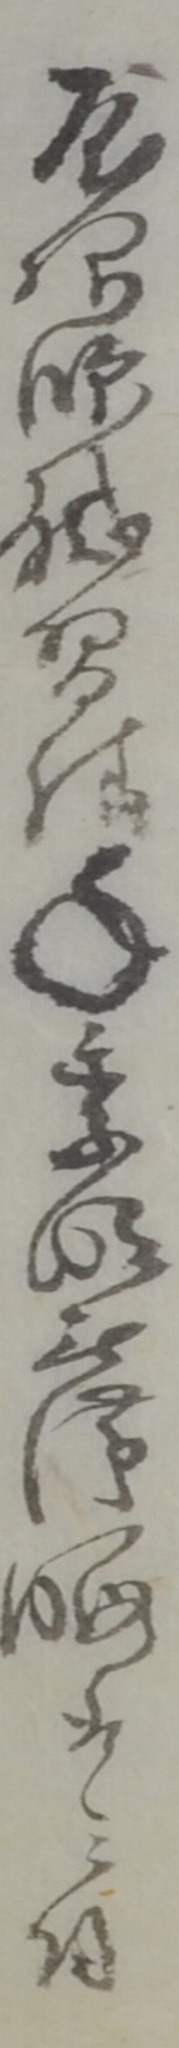屋根師職習請年季明無滞暇取候二付
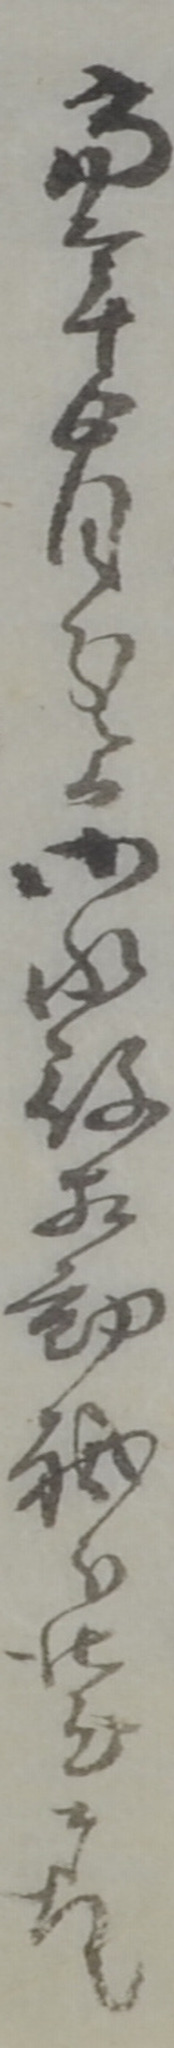当年ゟ自分ニ而御水役相勤職分仕度奉存候
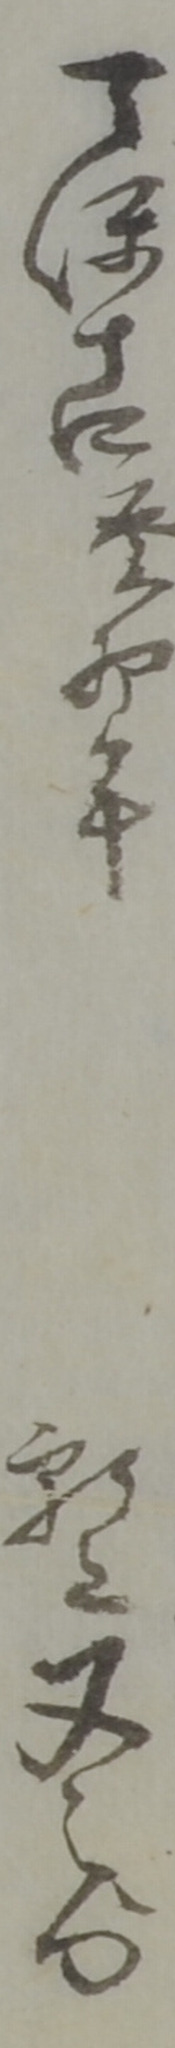天保十四癸卯年願主又右衛門
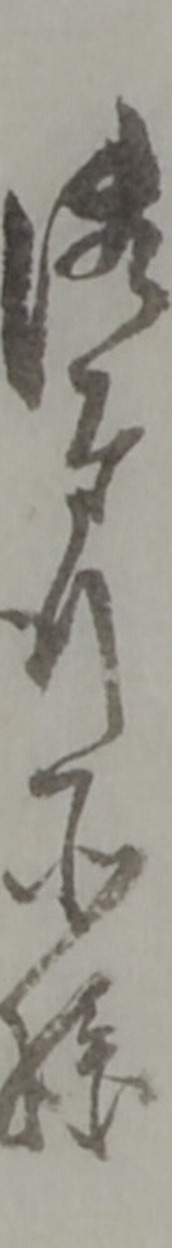御奉行所様
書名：諸願書控簿
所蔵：伊那市立高遠町図書館・合同会社AMANE
